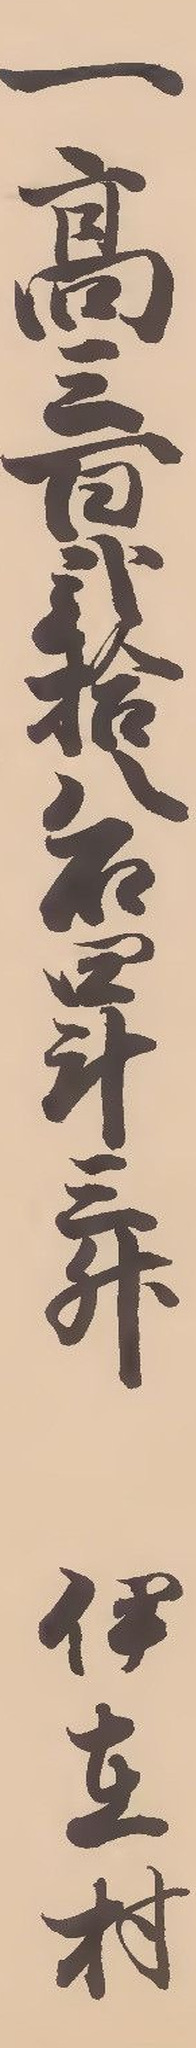一高三百弐拾八石四斗三升伊在村
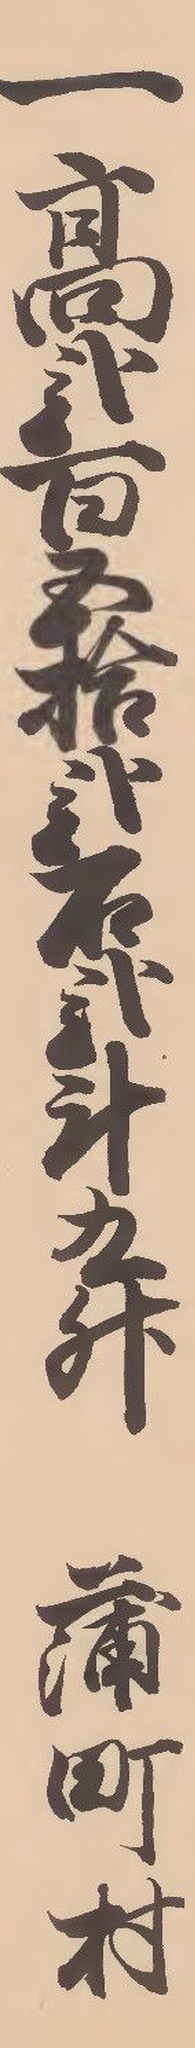一高弐百五拾弐石弐斗九升蒲町村
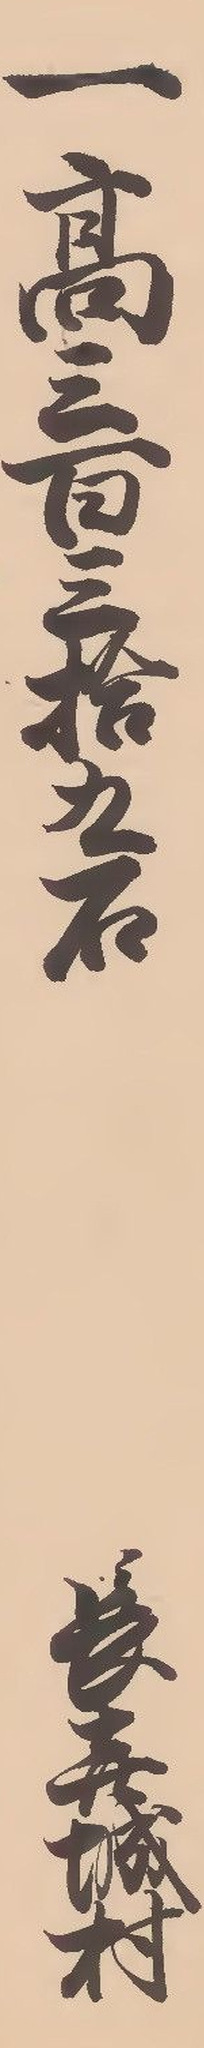一高三百三拾九石長喜城村
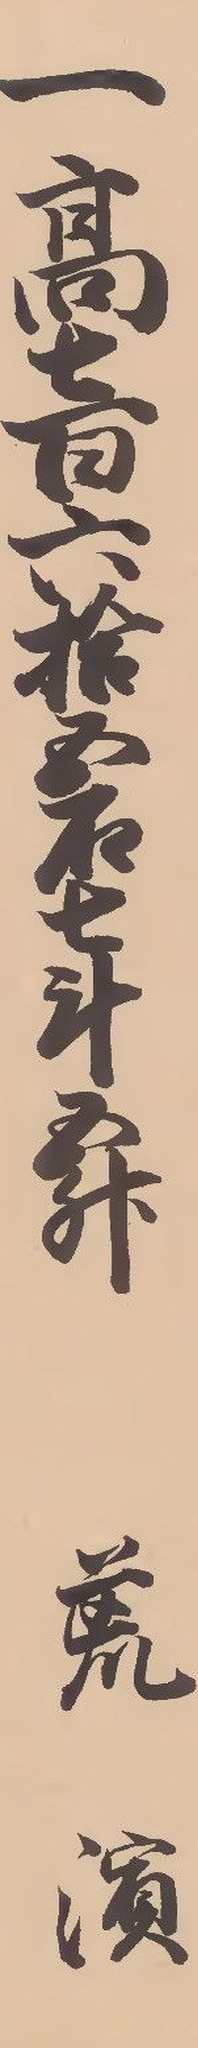一高七百六拾五石七斗五升荒浜
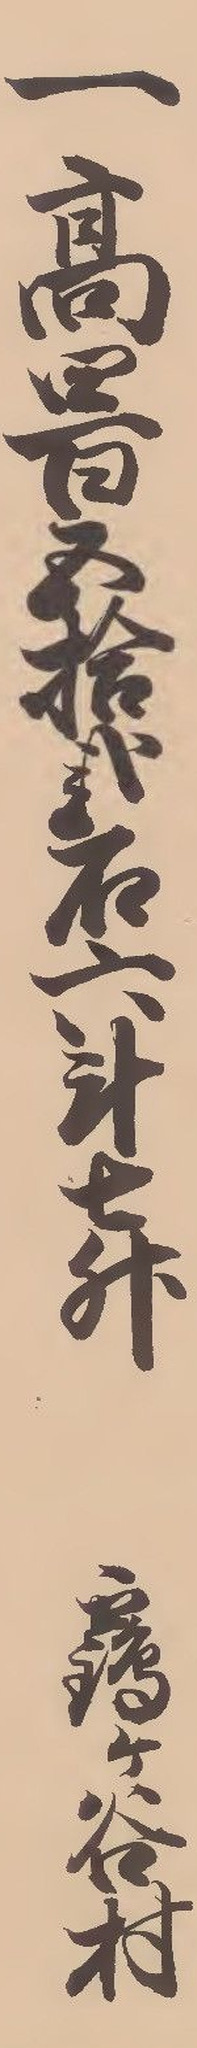一高四百五拾弐石六斗七升鶴ヶ谷村
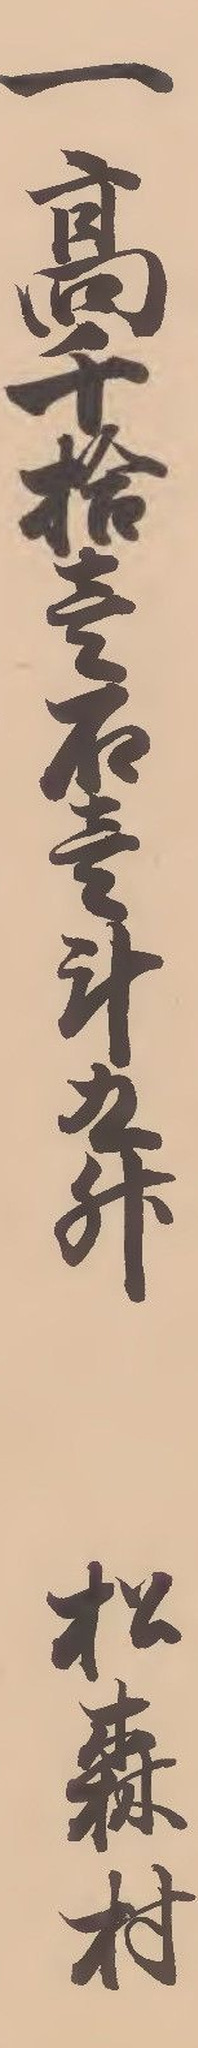一高千拾壱石壱斗九升松森村
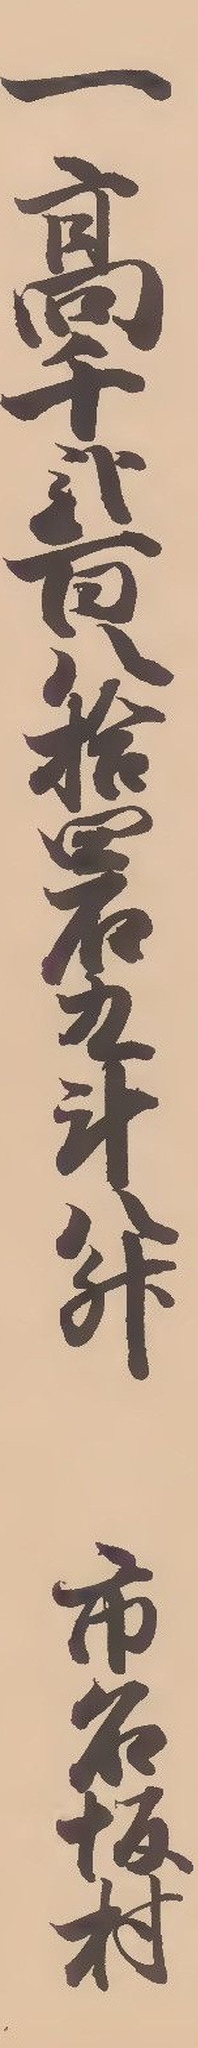一高千弐百八拾四石九斗八升市名坂村

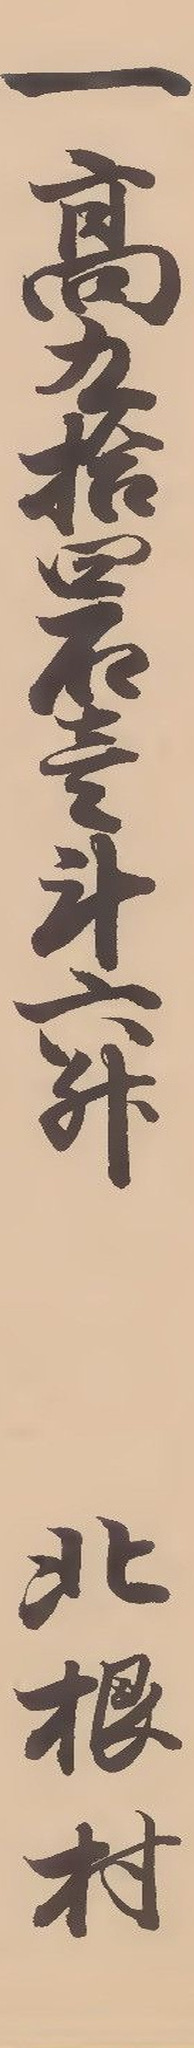一高九拾四石壱斗六升北根村
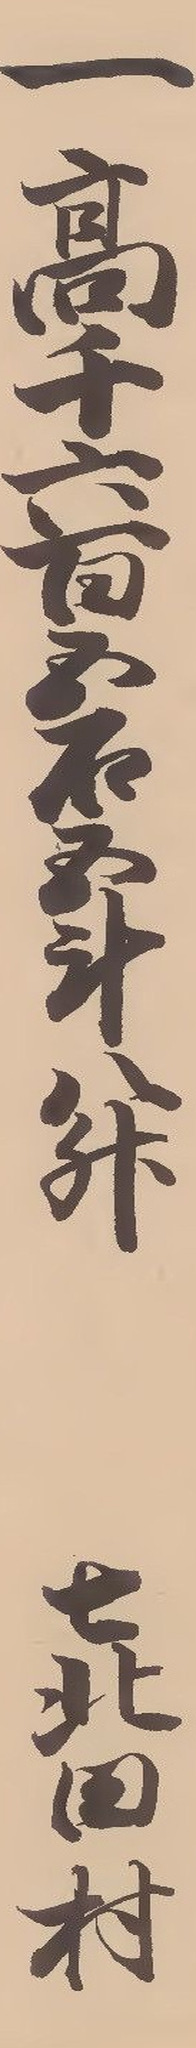一高千六百五石五斗八升七北田村
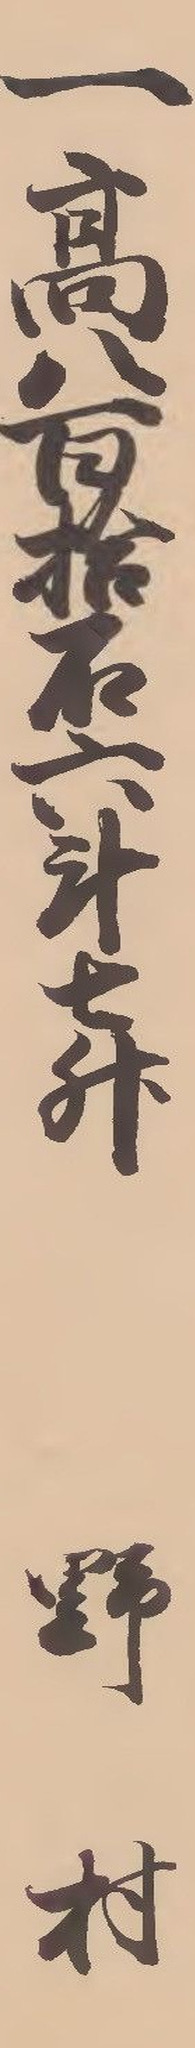一高八百拾石六斗七升野村
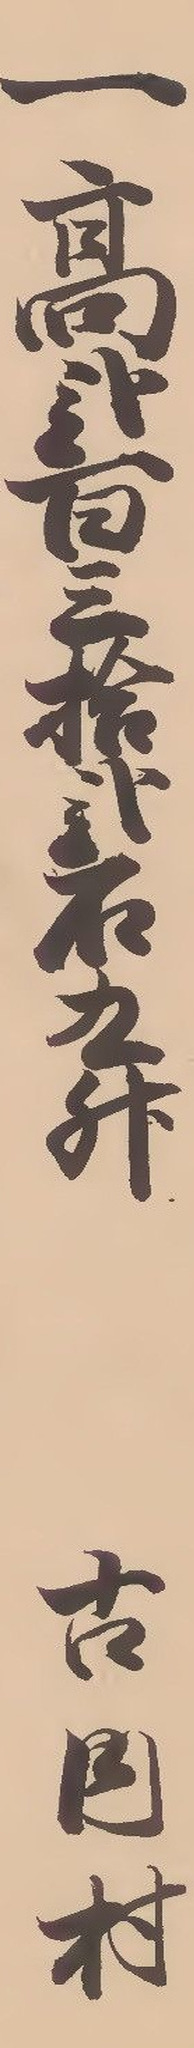一高弐百三拾弐石九升古内村
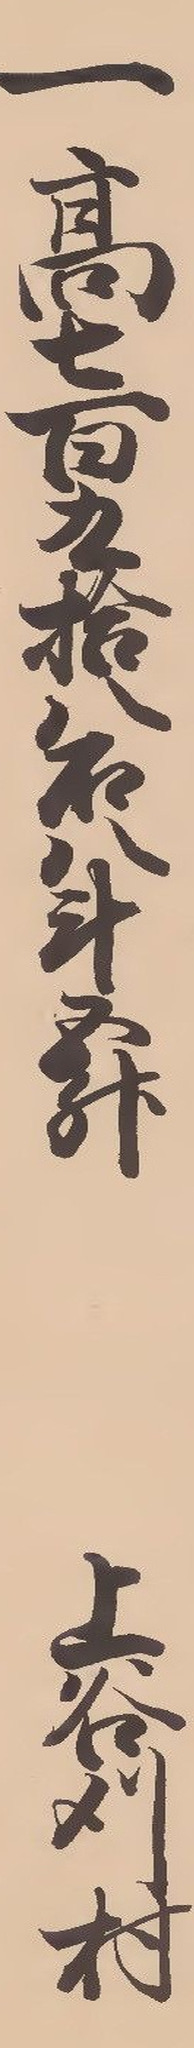一高七百九拾八石八斗五升上谷刈村
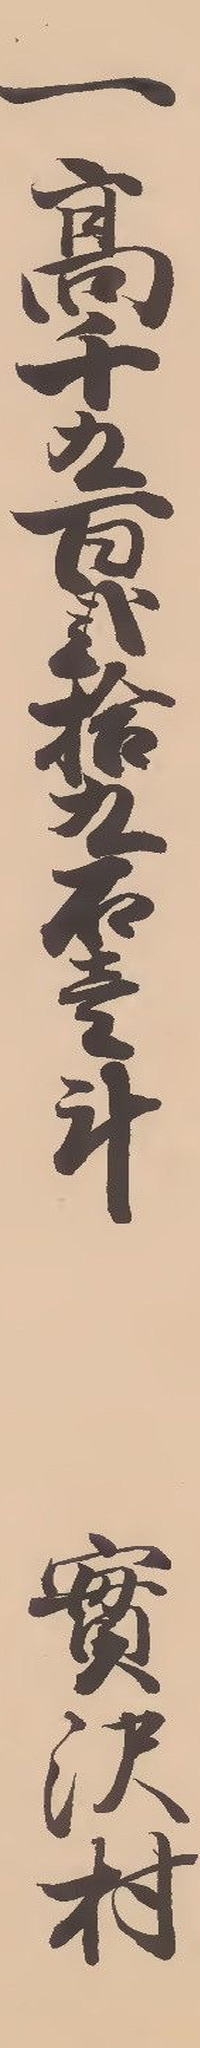一高千九百弐拾九石壱斗実沢村
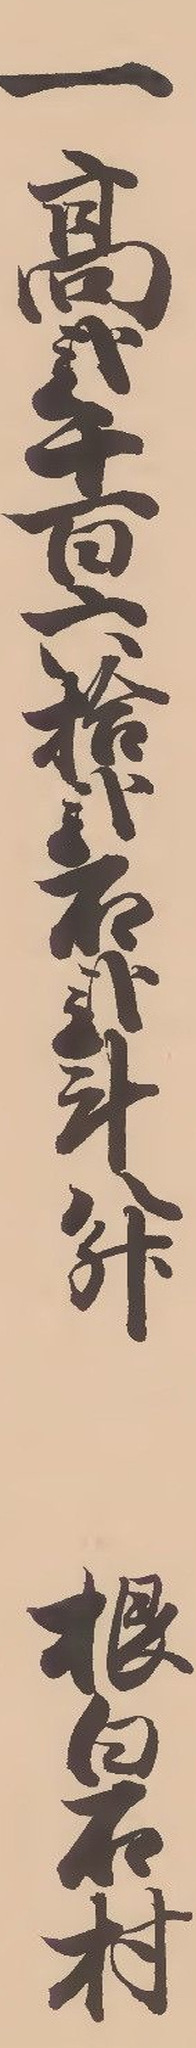一高弐千百六拾弐石弐斗八升根白石村
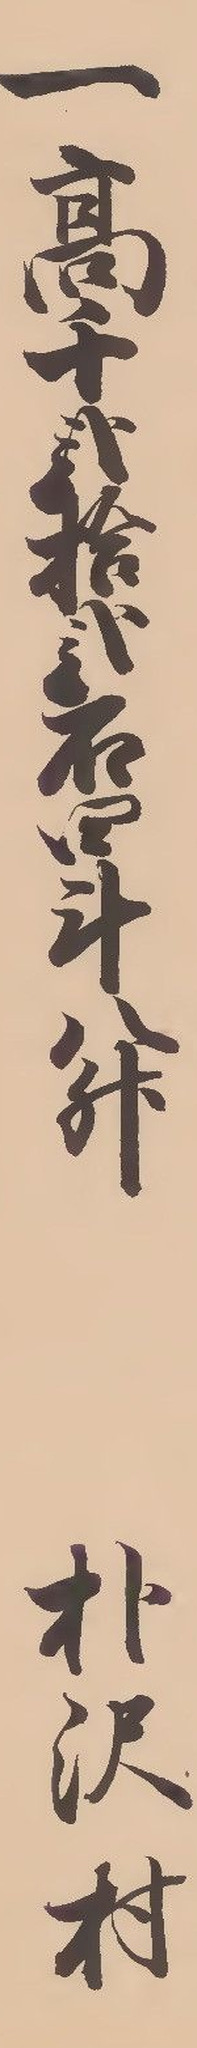一高千弐拾弐石四斗八升朴沢村

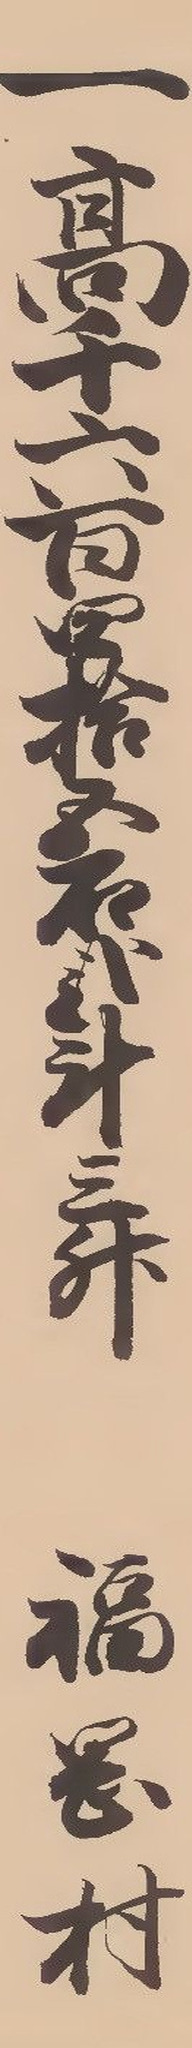一高千六百四拾五石弐斗三升福岡村
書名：陸奥国郷帳　５
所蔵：国立公文書館 National Archives of Japan
